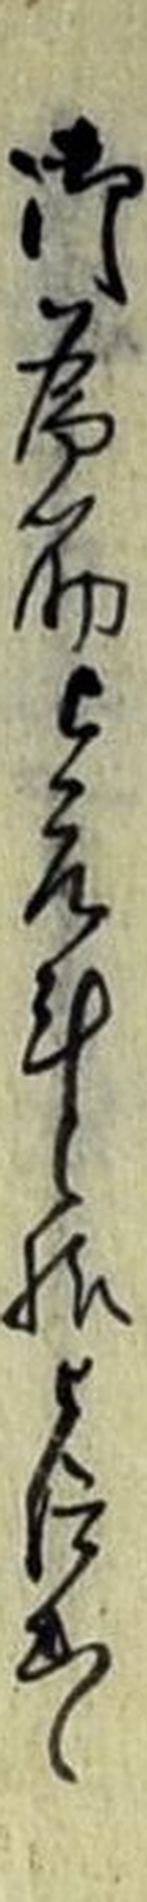御為筋被取計候様被仰出候
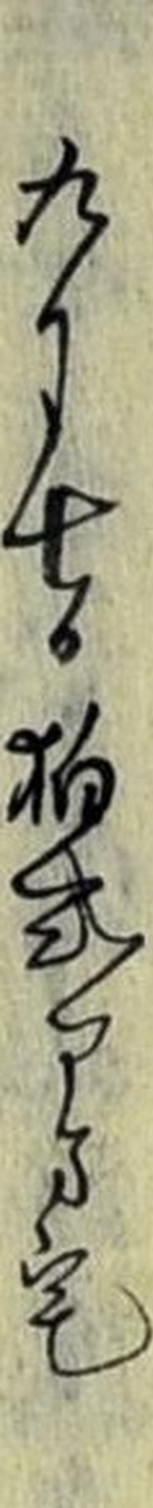九月七日狛式部方宅
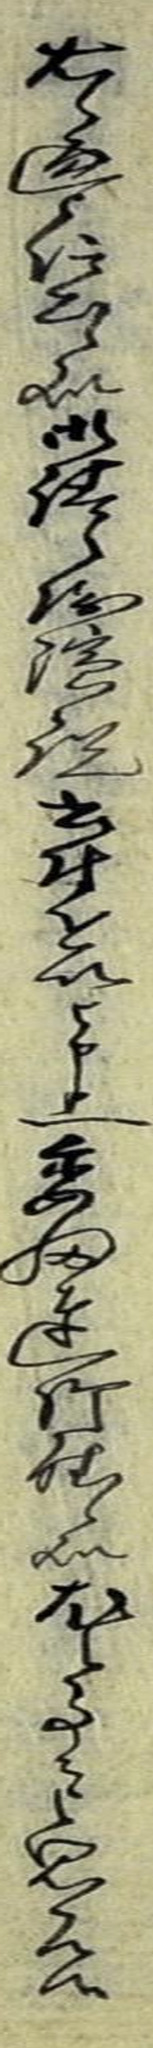右之通被仰出候処御請之儀演説書付を以被申上委細達御聴候処尤之事ニ被思召候
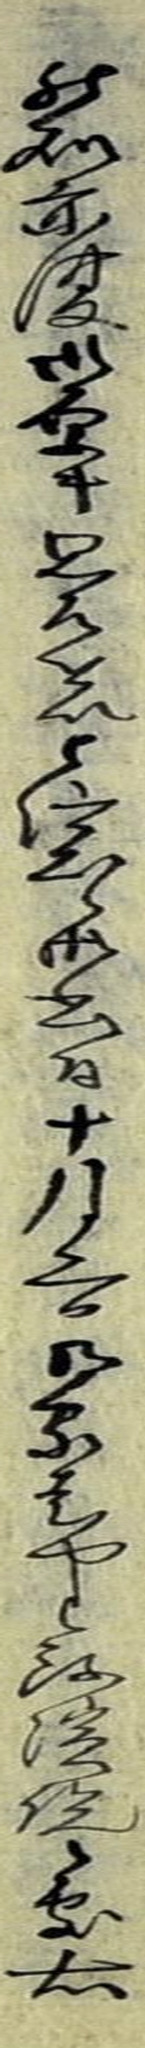然処亦復御厚キ思召を以被仰出候御書付十月二日御家老中被致演説候処右
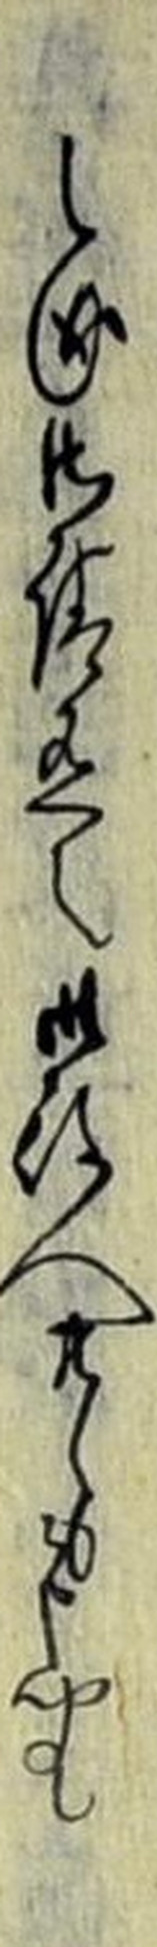之趣御請有之御役人共へも申聞候
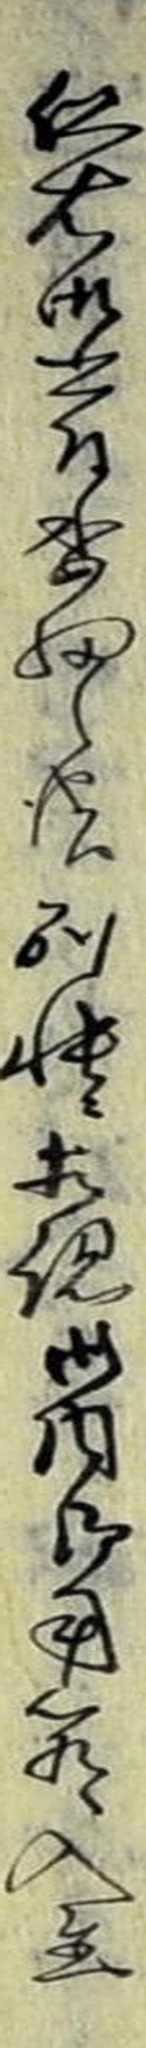但右御書付委細之儀ハ別紙ニ相認御内御用箱へ入置

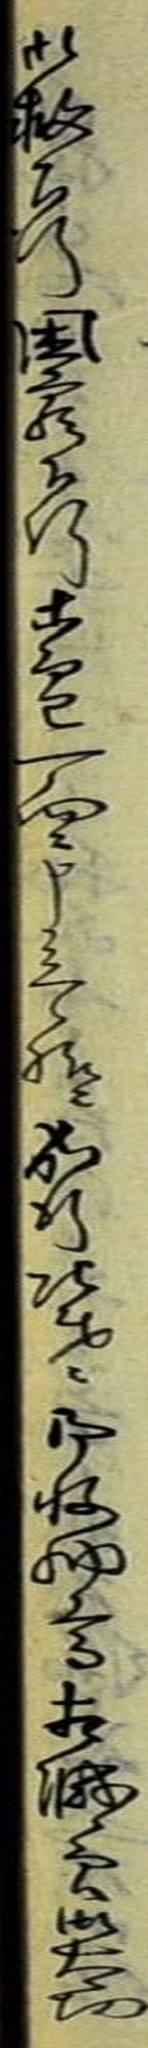御救下行困窮下行等而已一向ニ申立候様ニ成行次第ニ御収納高相減候而ハ御太切
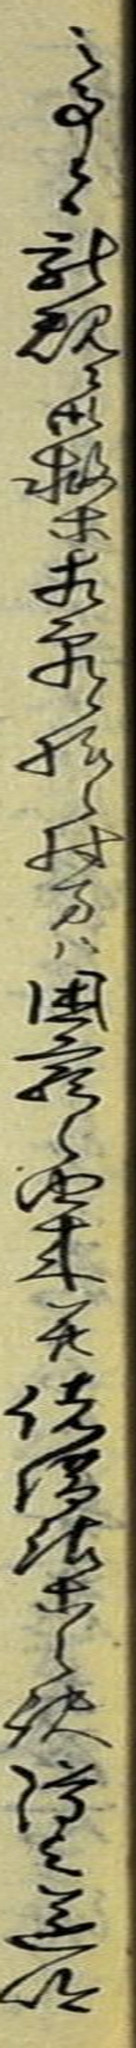之事ニ候新規ニ御救等相願候様之村方ハ困窮之由来并諸借銀等之訳得与遂吟

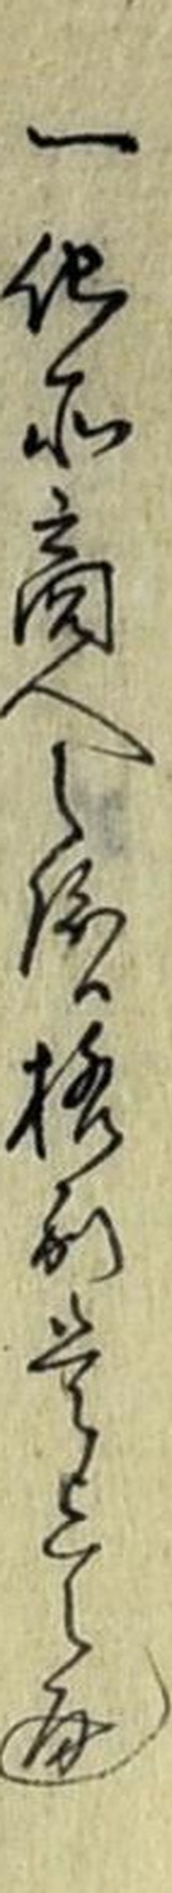一他所商人之儀ハ格別是迄之通
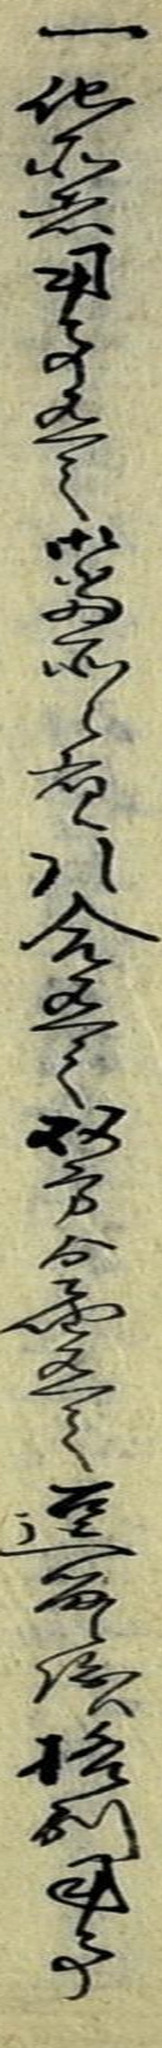一他所者用事有之御当所之者へ引合有之双方ゟ届有之逗留之儀ハ格別用事
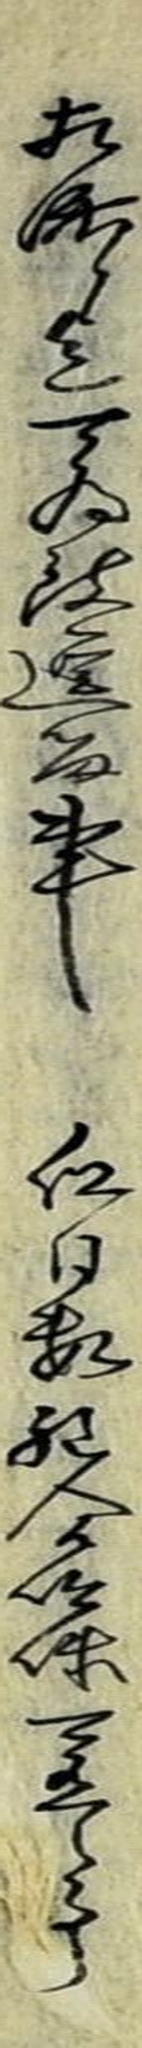相済候迄可為致逗留事但日数程合吟味可有之事
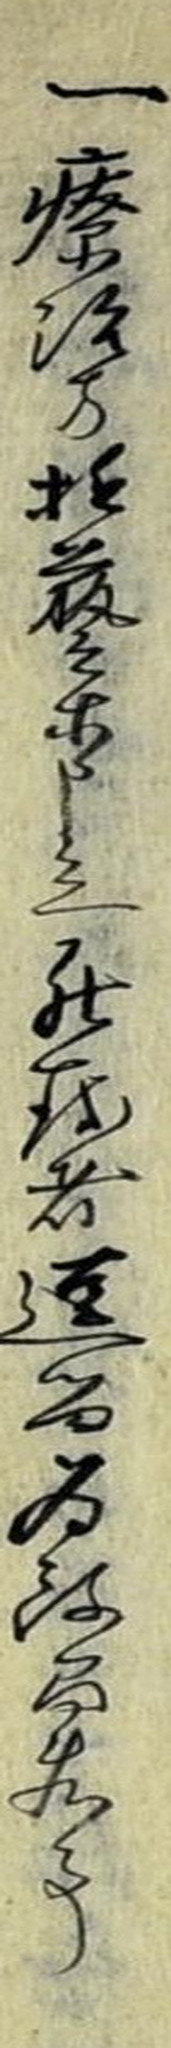一療治方遊芸等申立罷越者逗留為致間敷事
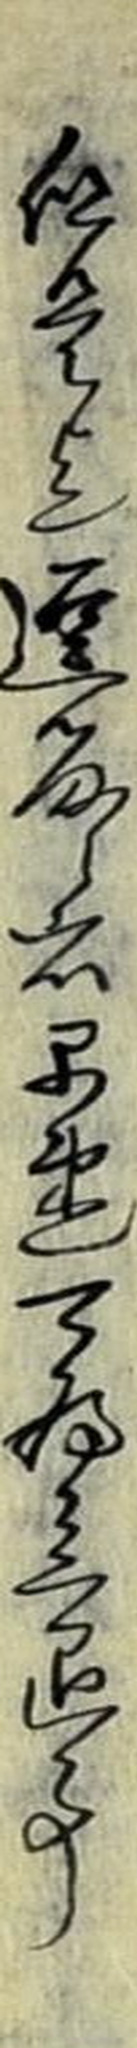但是迄逗留之者早速可為立退事
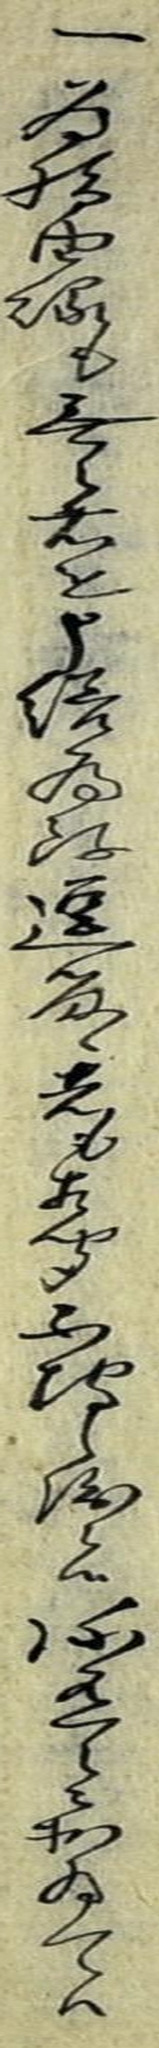一為指由縁も無之者を申繕為致逗留候者も相聞不埒之儀ニ候弥有之ニおゐてハ
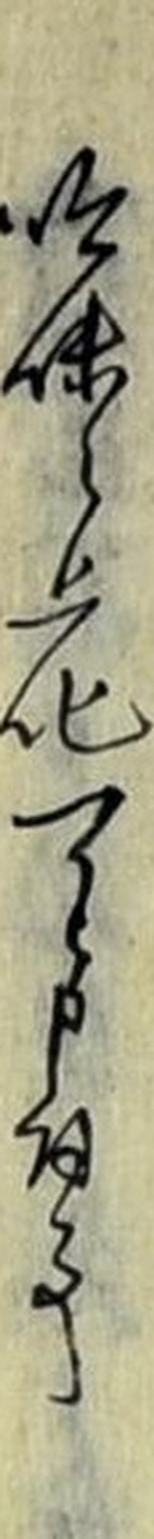吟味之上叱可被申付事
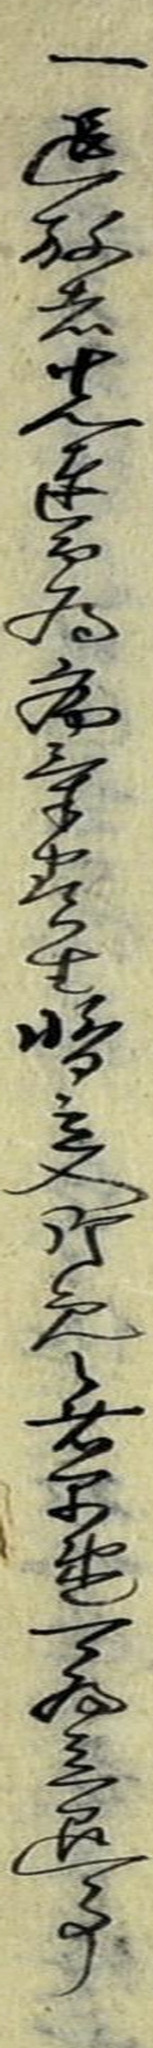一追放者先達而為病気養生暫立入御免之者早速可為立退事
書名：命令之部 三
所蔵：福井県文書館 Fukui Prefectural Archives
